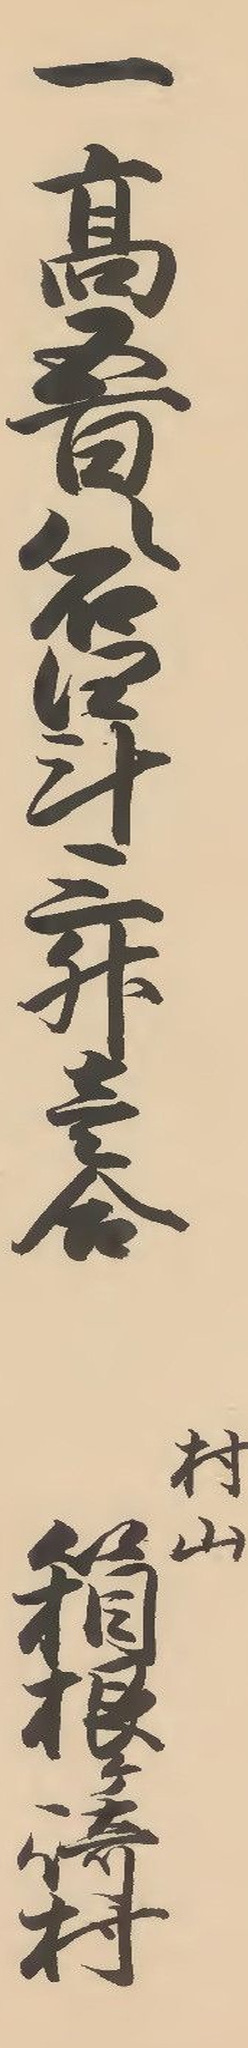一高五百八石四斗三升壱合箱根ヶ崎村
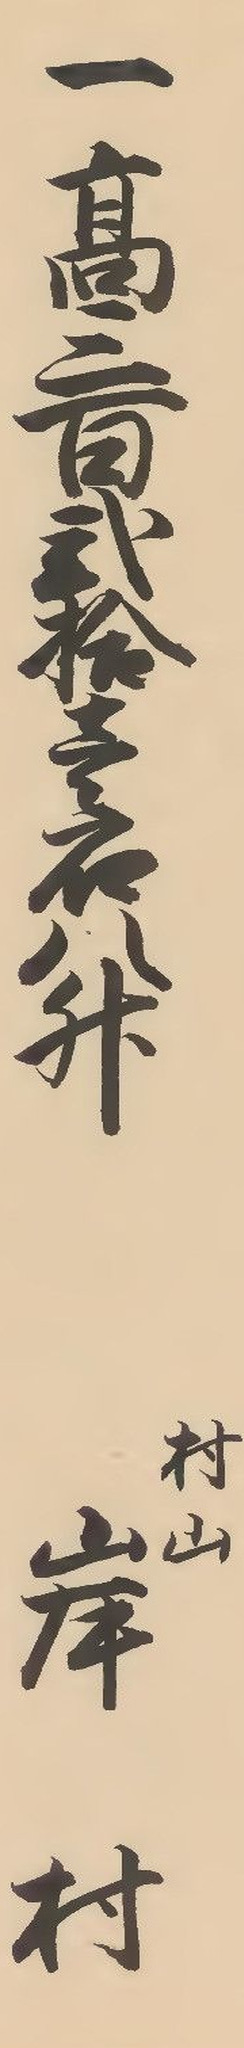一高三百弐拾壱石八升岸村
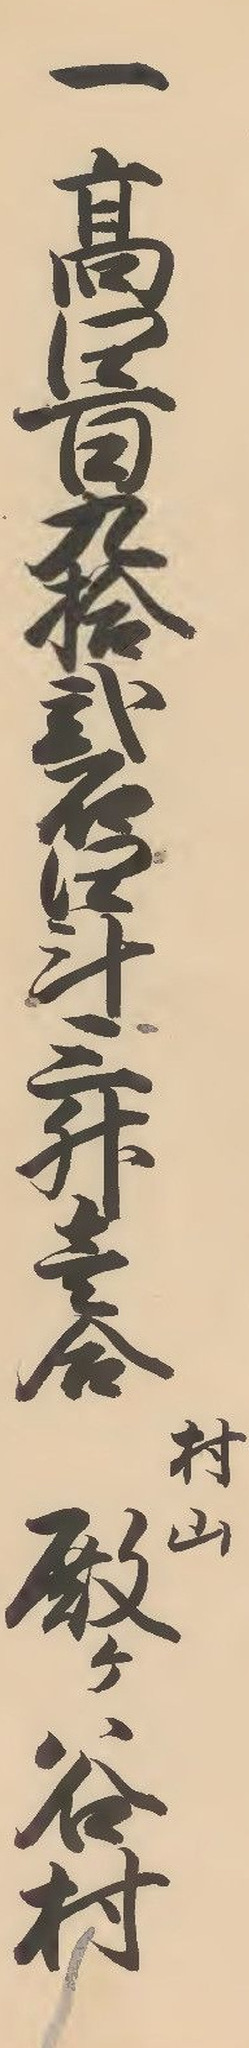一高四百九拾弐石四斗三升壱合殿ヶ谷村

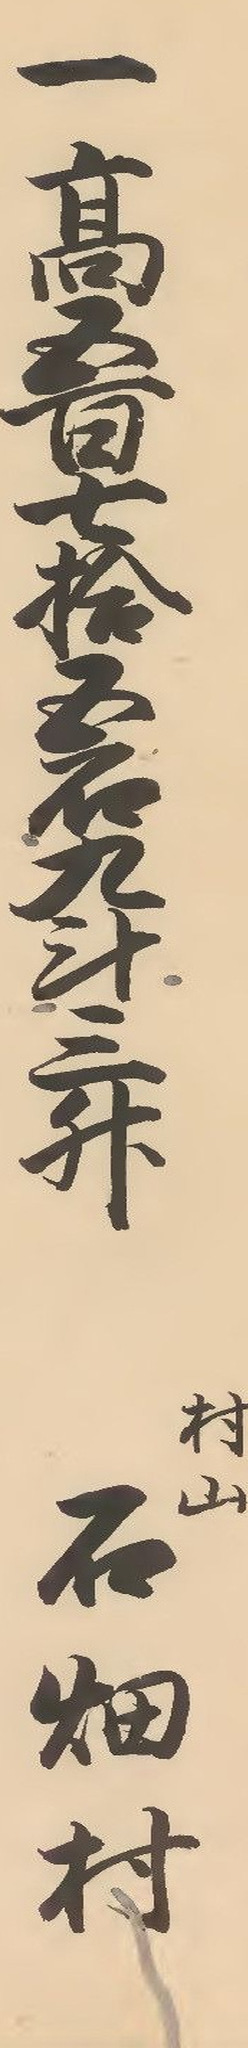一高五百七拾五石九斗三升石畑村
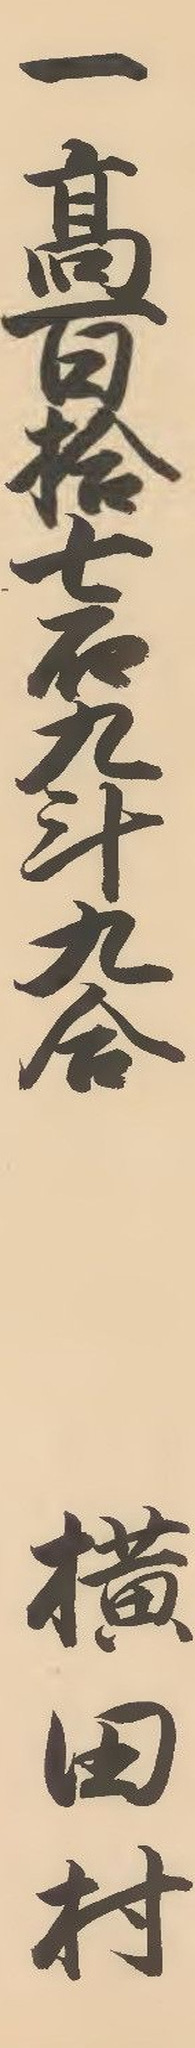一高百拾七石九斗九合横田村
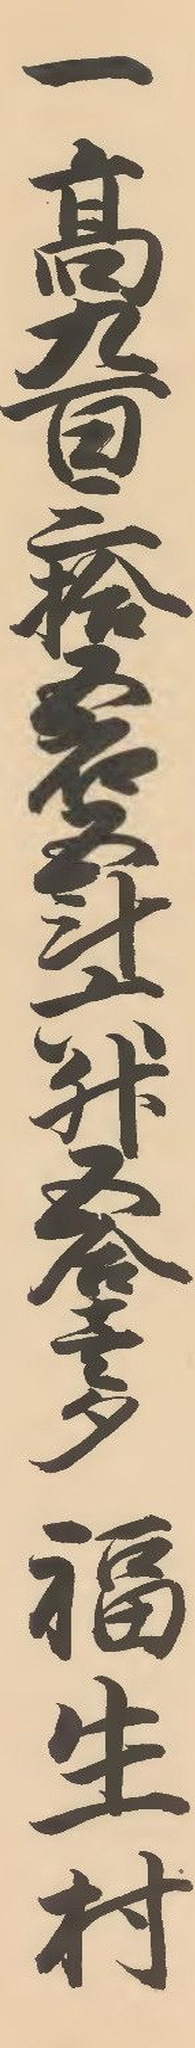一高九百三拾五石五斗六升五合壱勺福生村
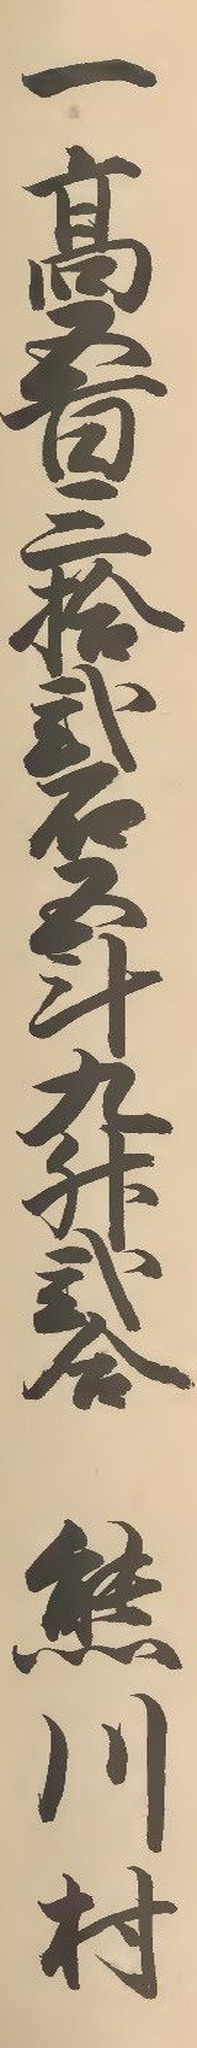一高五百三拾弐石五斗九升弐合熊川村
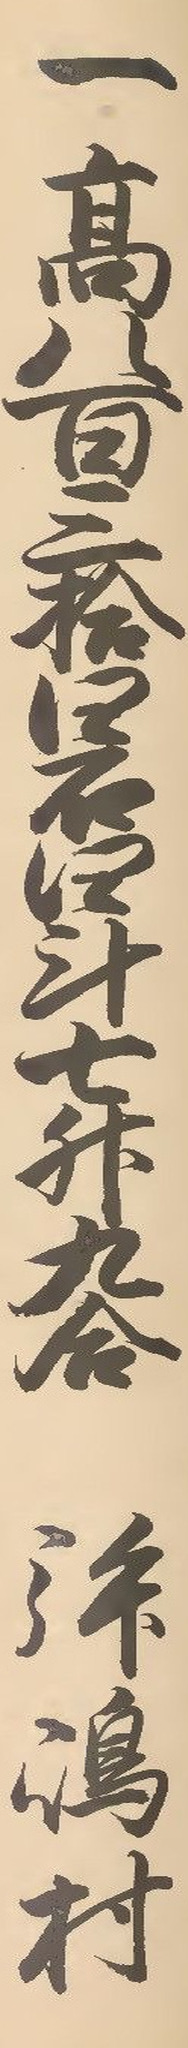一高八百三拾四石四斗七升九合拝嶋村
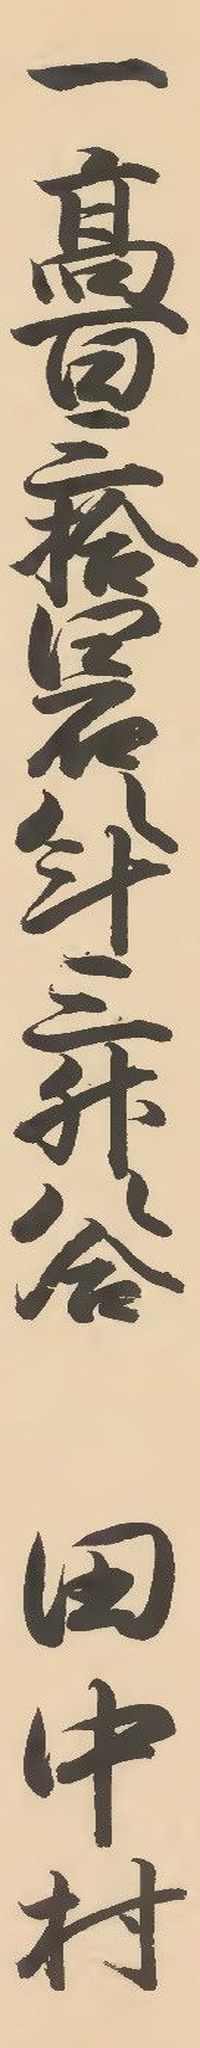一高百三拾四石八斗三升八合田中村
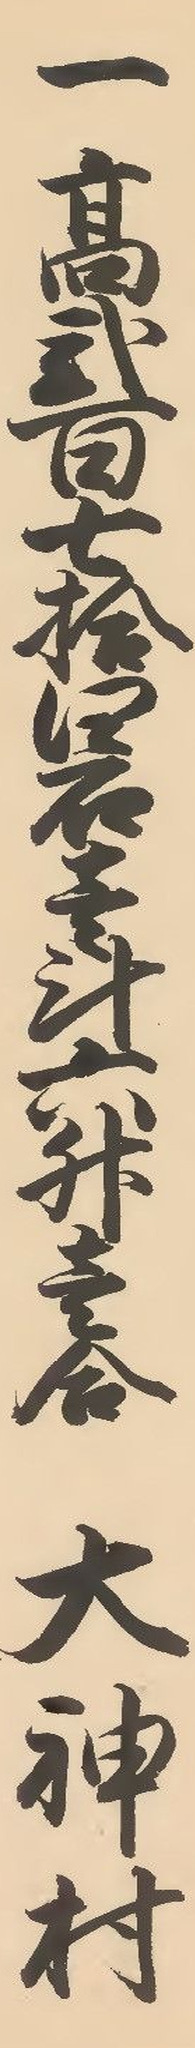一高弐百七拾四石壱斗六升壱合大神村
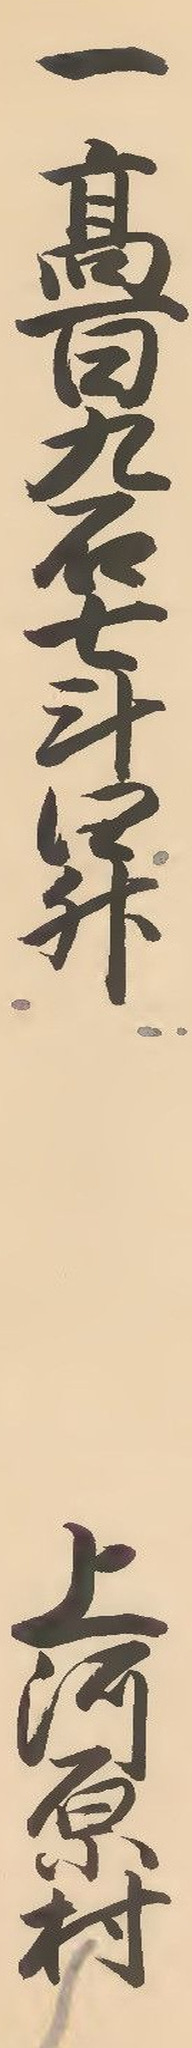一高百九石七斗四升上河原村

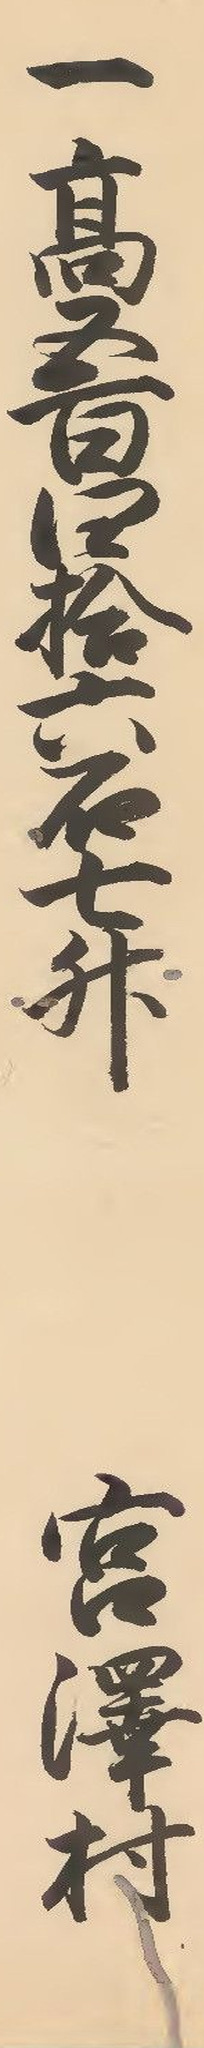一高五百四拾六石七升宮澤村
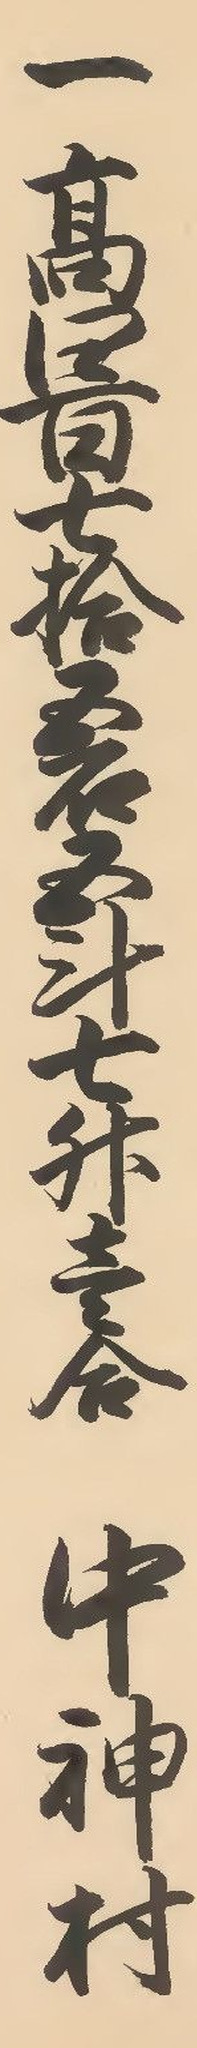一高四百七拾五石五斗七升壱合中神村
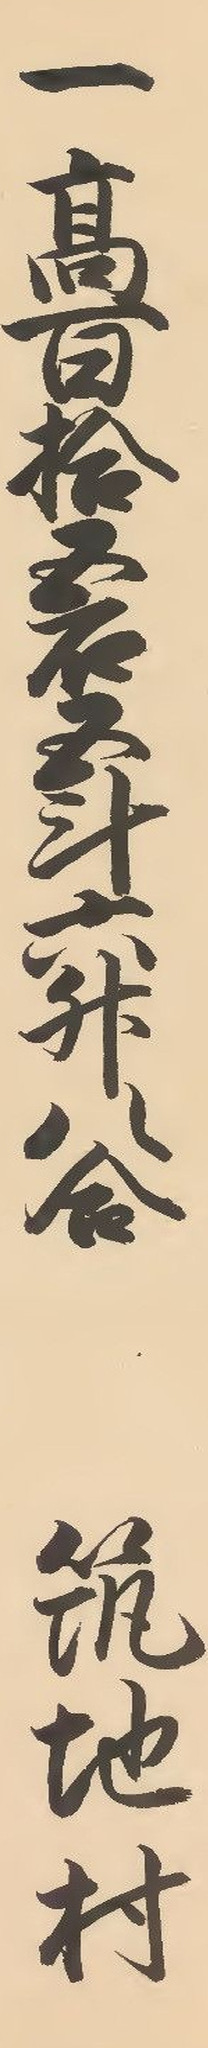一高百拾五石五斗六升八合筑地村
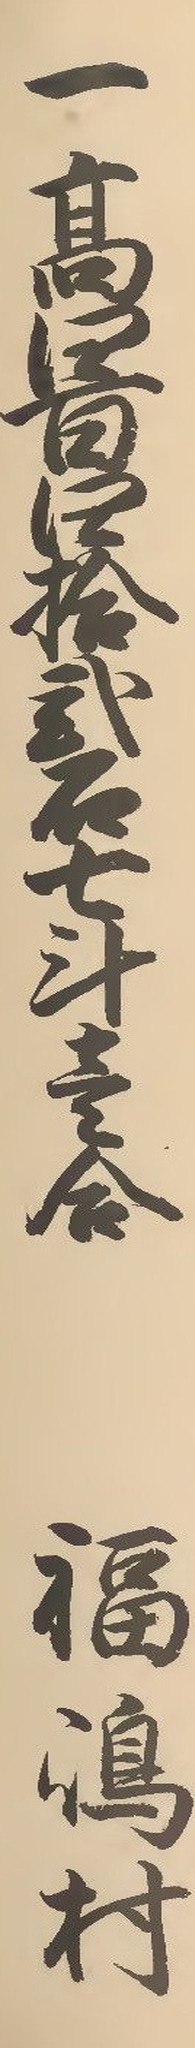一高四百四拾弐石七斗壱合福嶋村
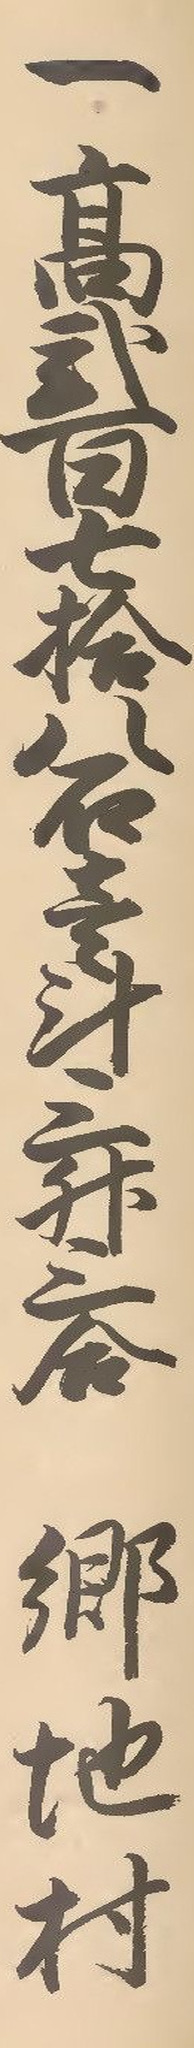一高弐百七拾八石壱斗三升三合郷地村
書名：武蔵国郷帳　上
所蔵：国立公文書館 National Archives of Japan
